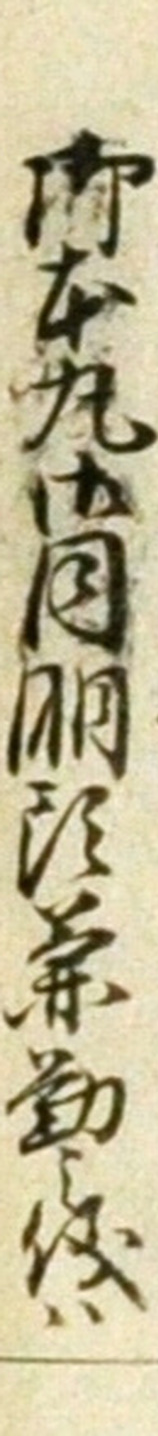御本丸御同朋頭兼勤之儀ハ
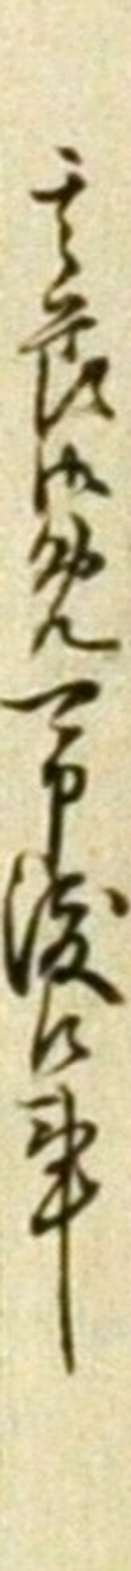其節御免可申渡候事
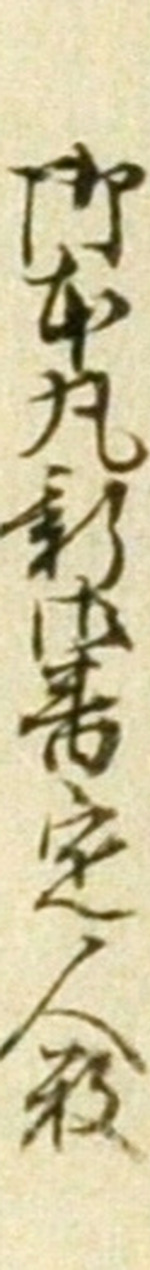御本丸晋御番定人数
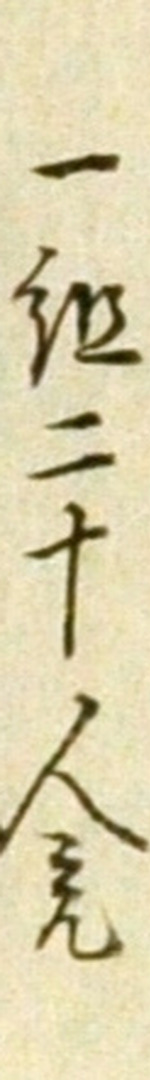一組二十人充
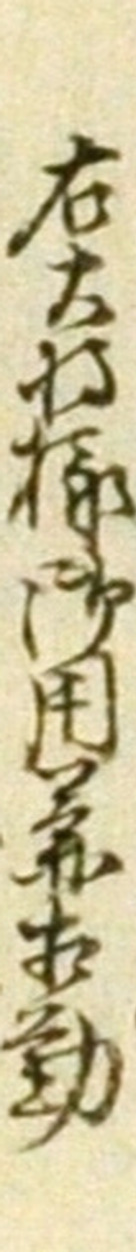右大将様御用兼相勤
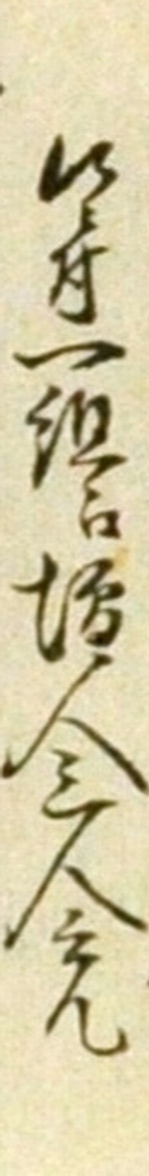候ニ付一組江増人三人充
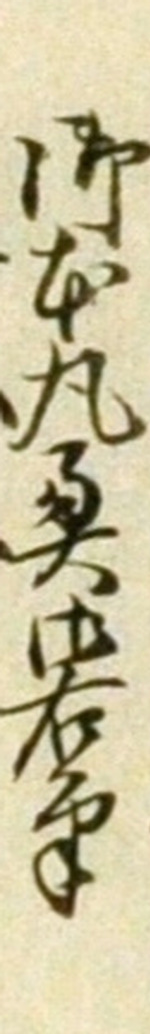御本丸奥御右筆
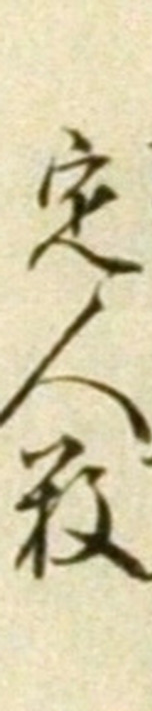定人数
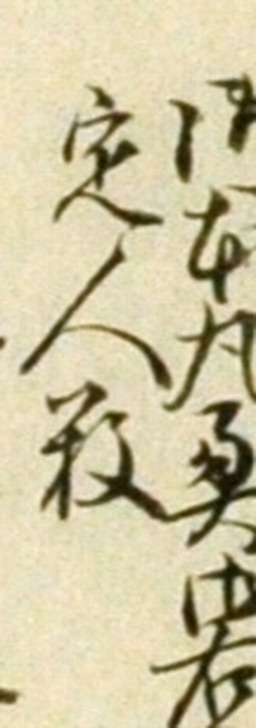定人数
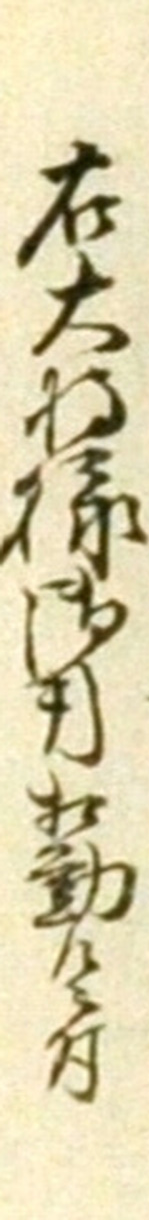右大将様御用相勤候ニ付
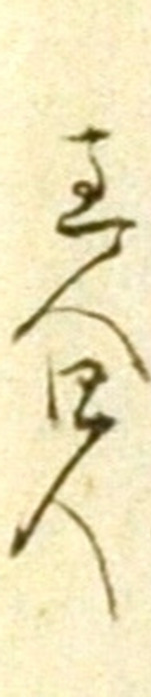過人四人

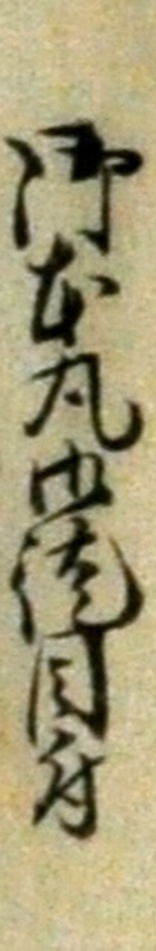御本丸御徒目付
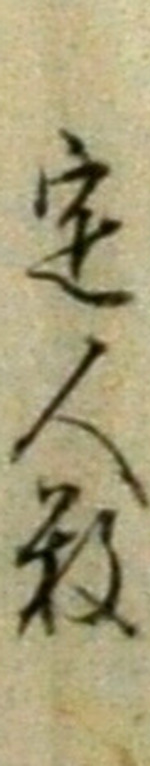定人数
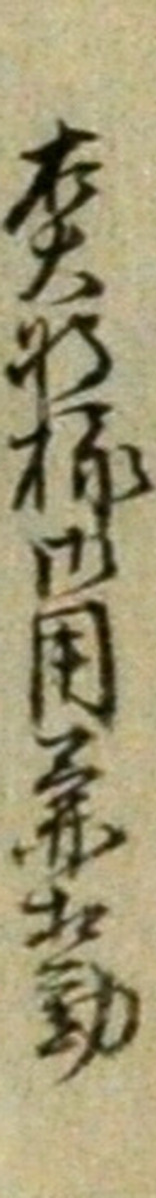右大将様御用兼相勤
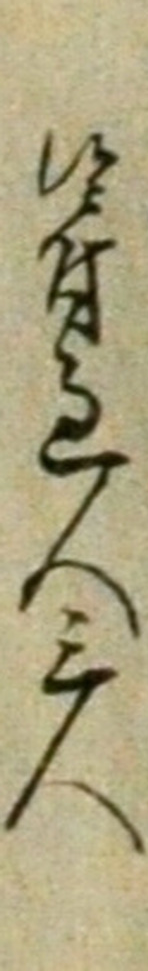候ニ付過人三人
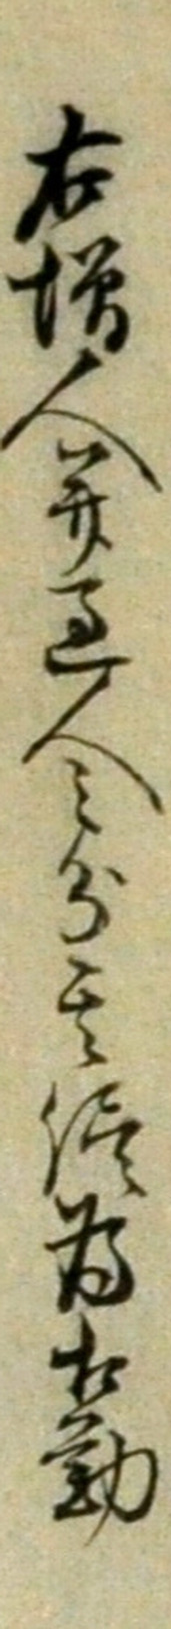右増人并過人之分其侭為相勤
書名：若年寄御役中御調書付
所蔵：伊那市立高遠町図書館・合同会社AMANE
